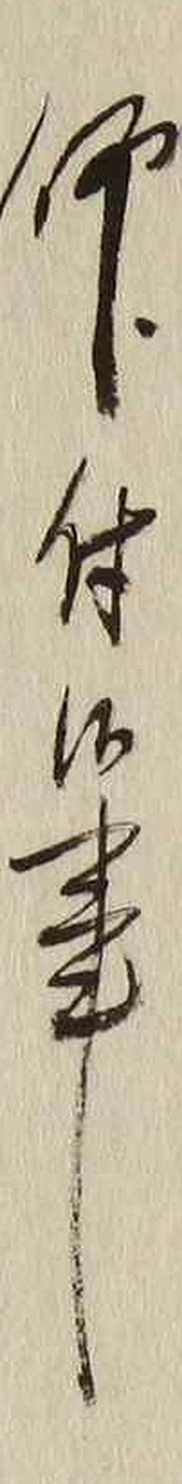仰付候事
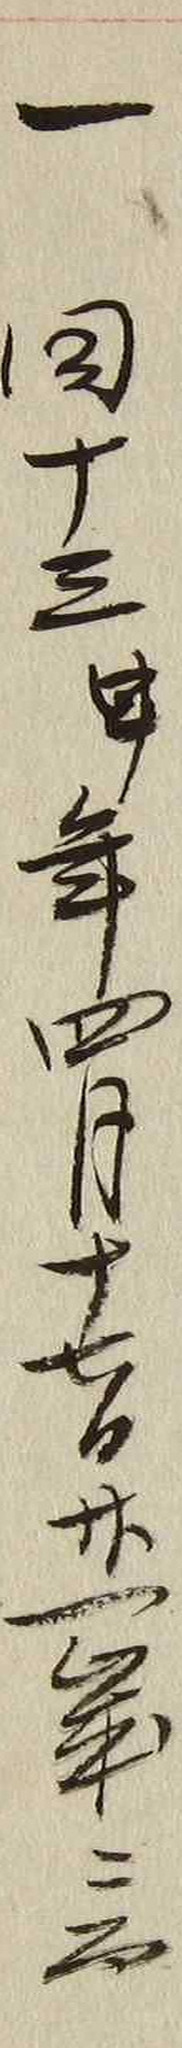一同十三申年四月十七日廿一歳ニ而
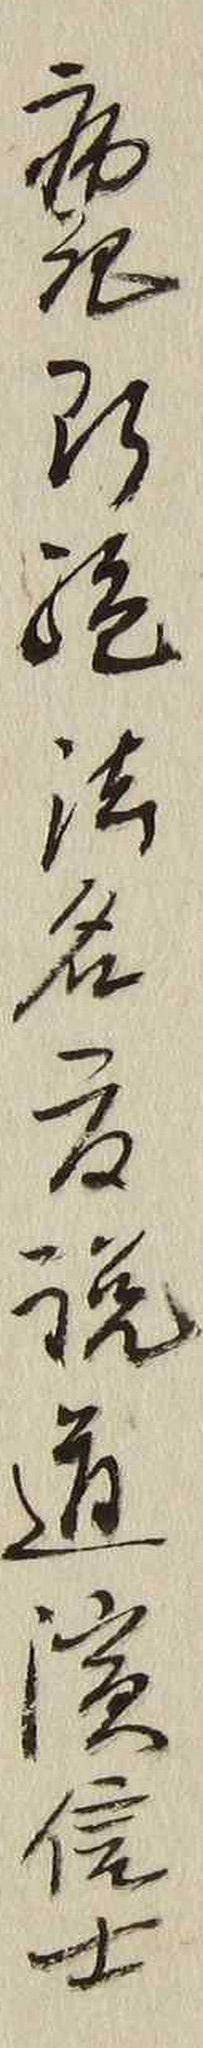病死断絶法名夏説道演信士
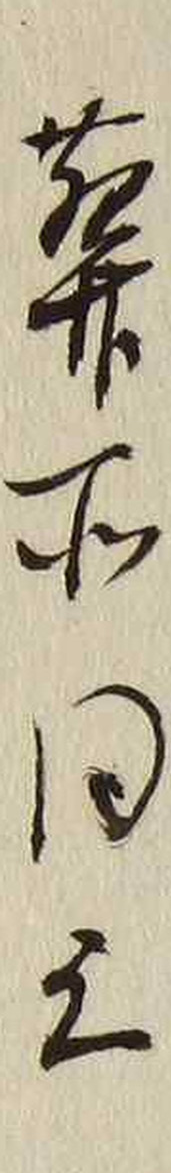葬所同上
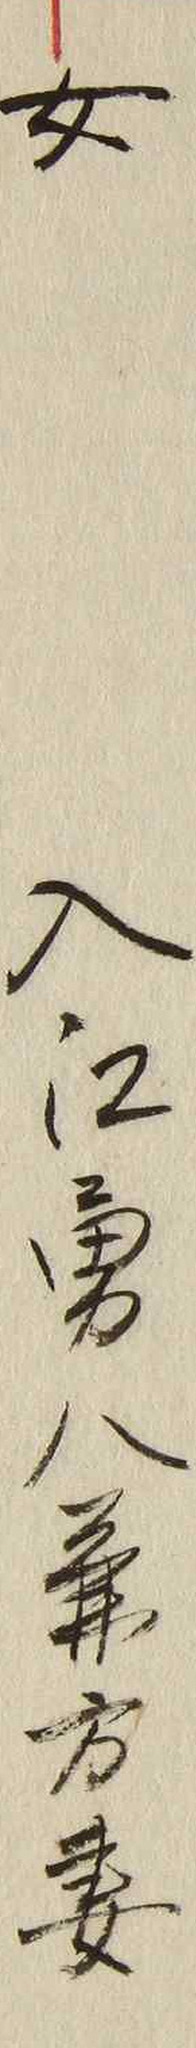女入江勇八兼方妻
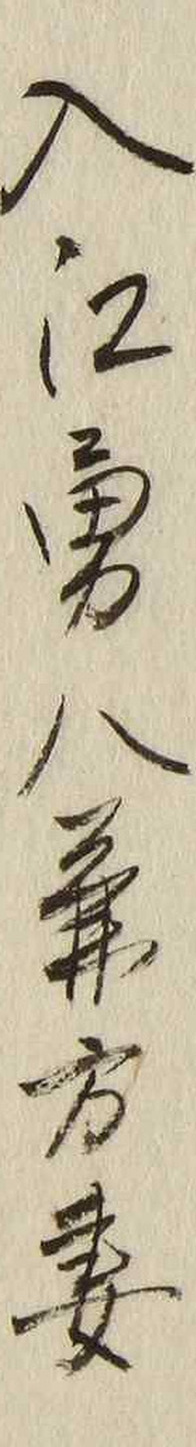女入江勇八兼方妻

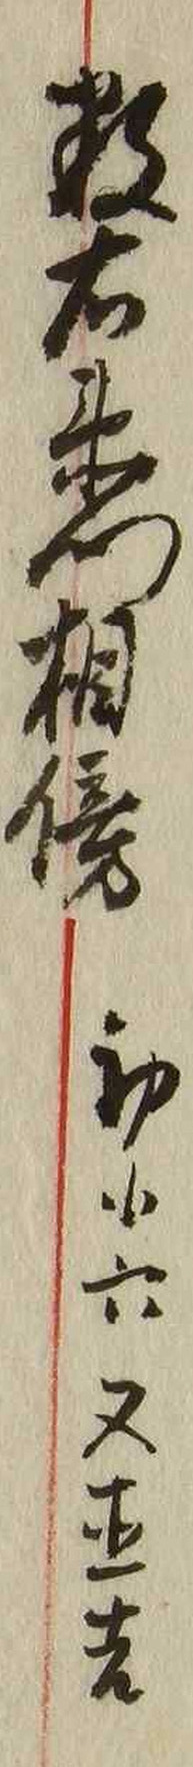数右衛門相傍初小六又直吉
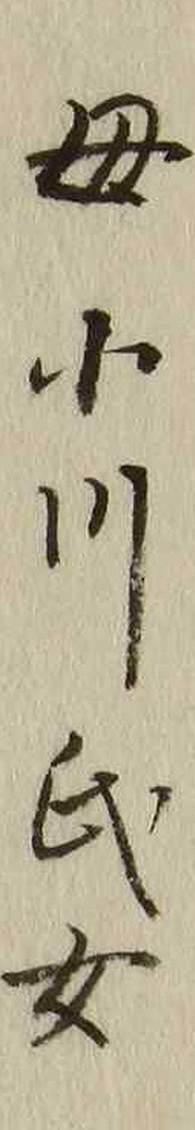母小川氏女
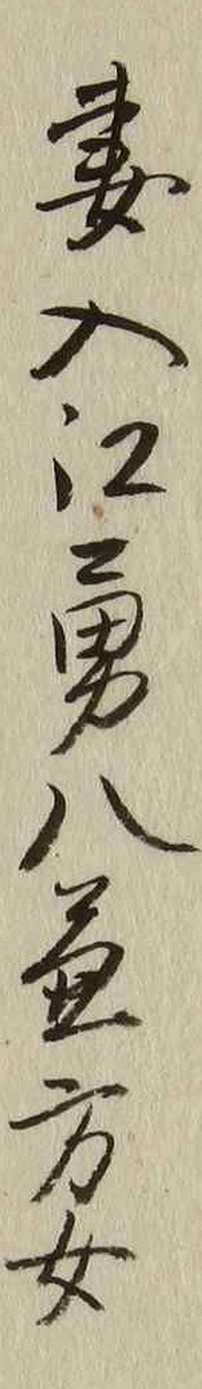妻入江勇八兼方女
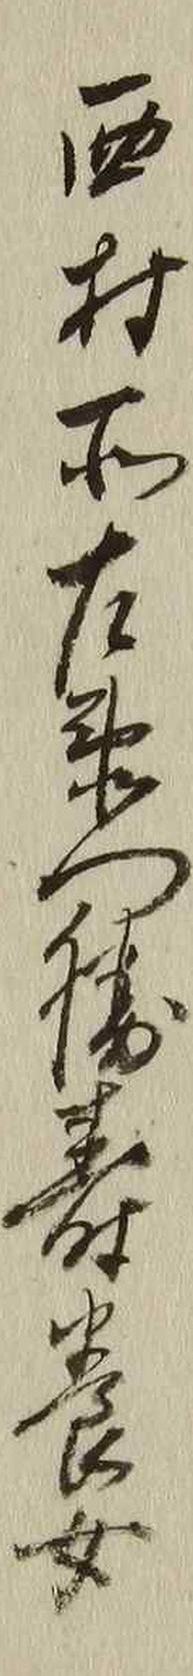西村所左衛門勝寿養女
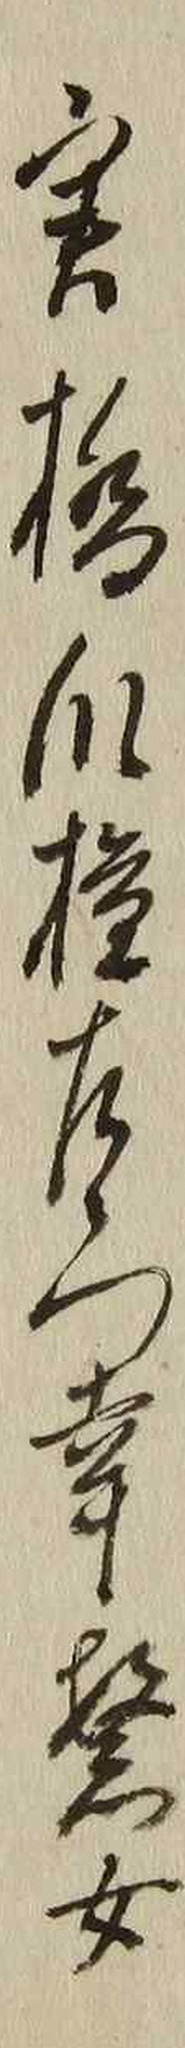実橋爪権左候門幸繁女
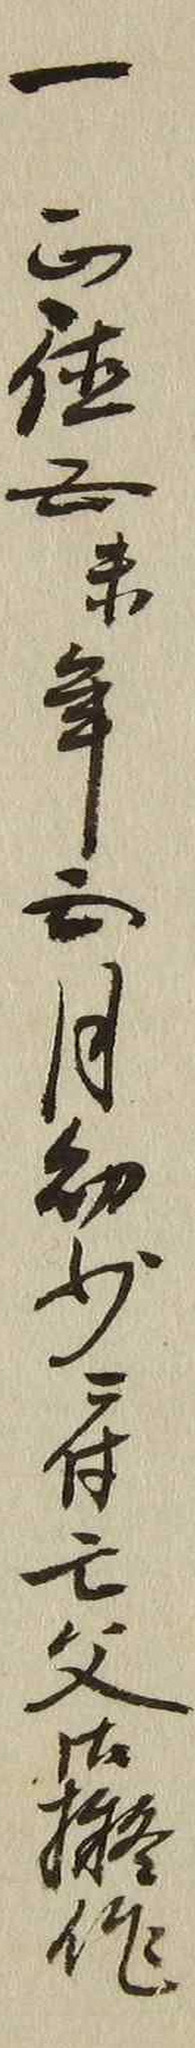一正徳五未年五月幼少ニ付亡父御擬作
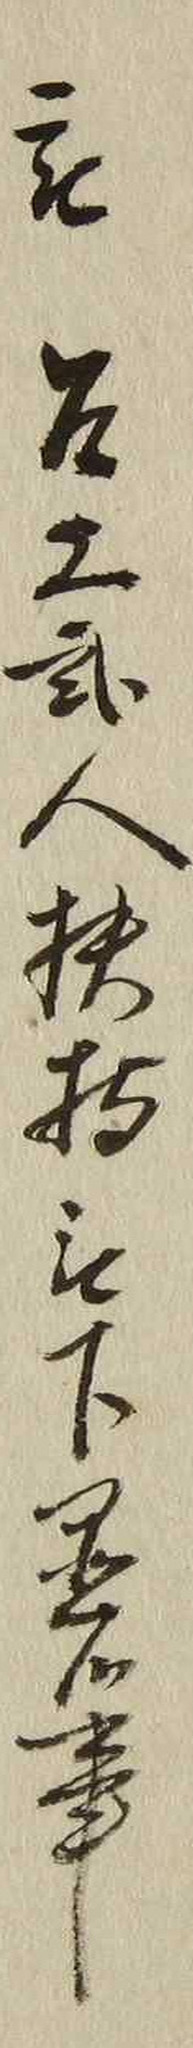被召上弐人扶持被下置候事
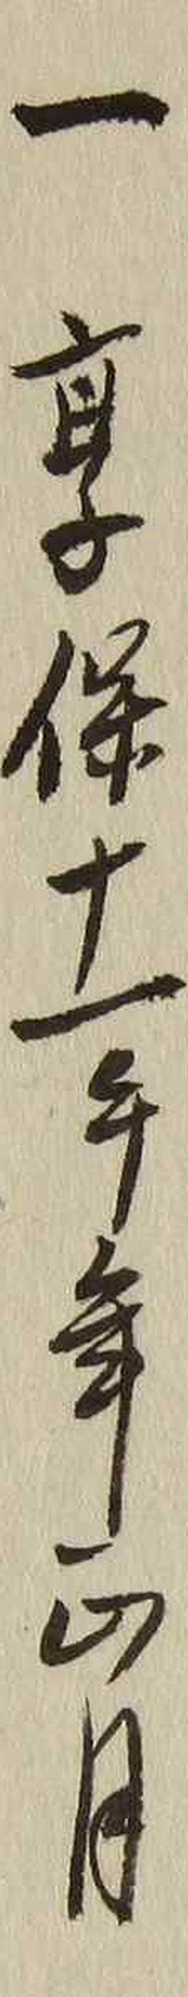一享保十一午年正月
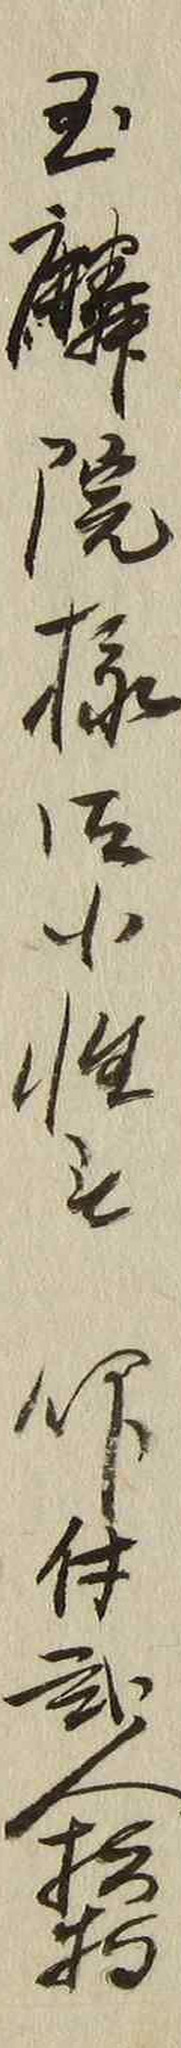玉鱗院様御小性被仰付弐人扶持
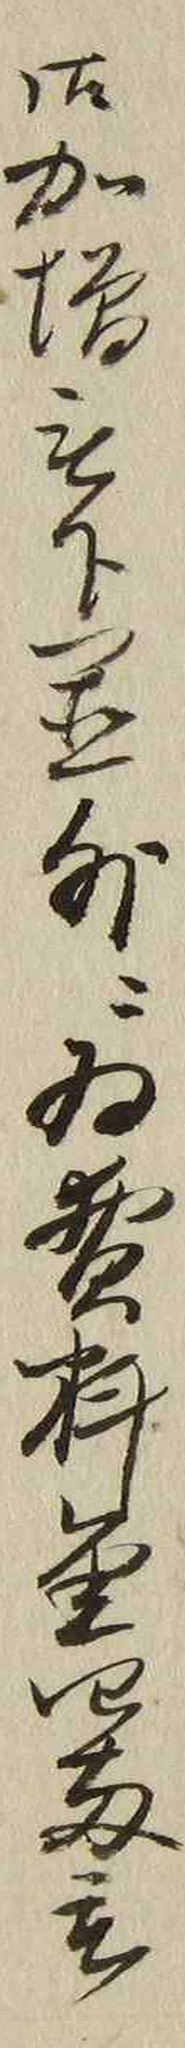御加増被下置外ニ為費料金四両被
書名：諸士系譜　巻之349　も之部5
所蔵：会津若松市立会津図書館
